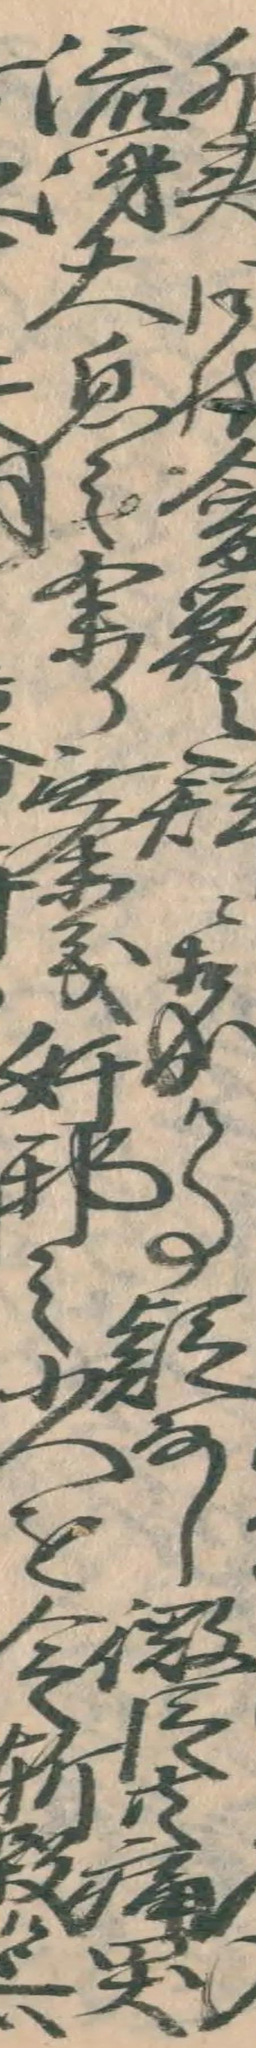流涕大息之余り無余義奸邪之小人を令斬殺候上ハ
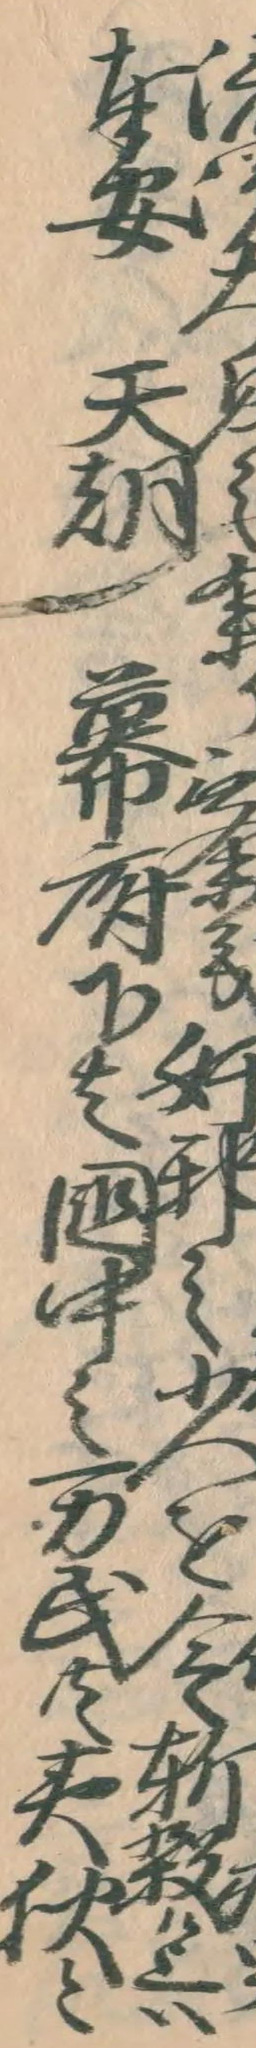奉安天朝幕府下者国中之万民共夷狄と

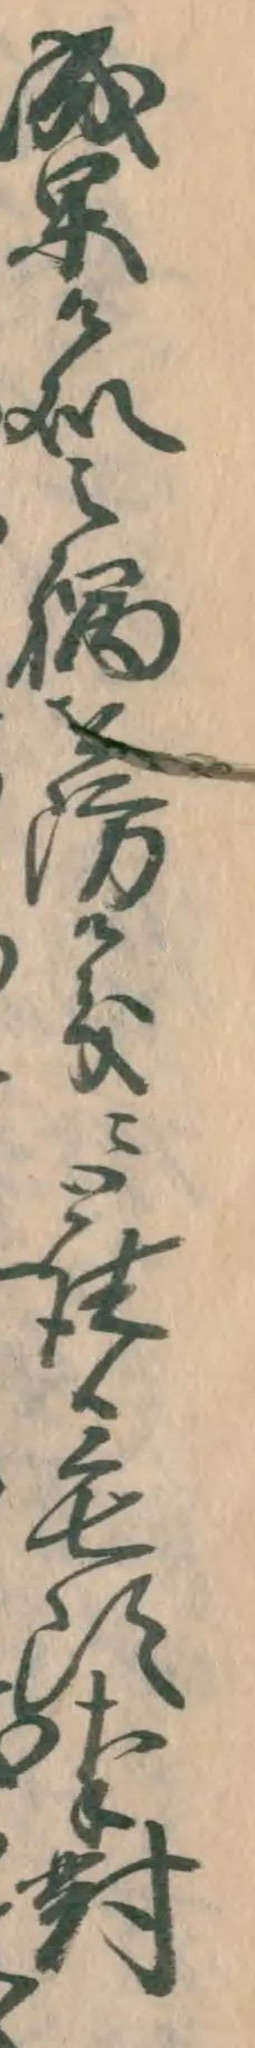成果候処之禍を防候義ニ御座候毛頭奉對
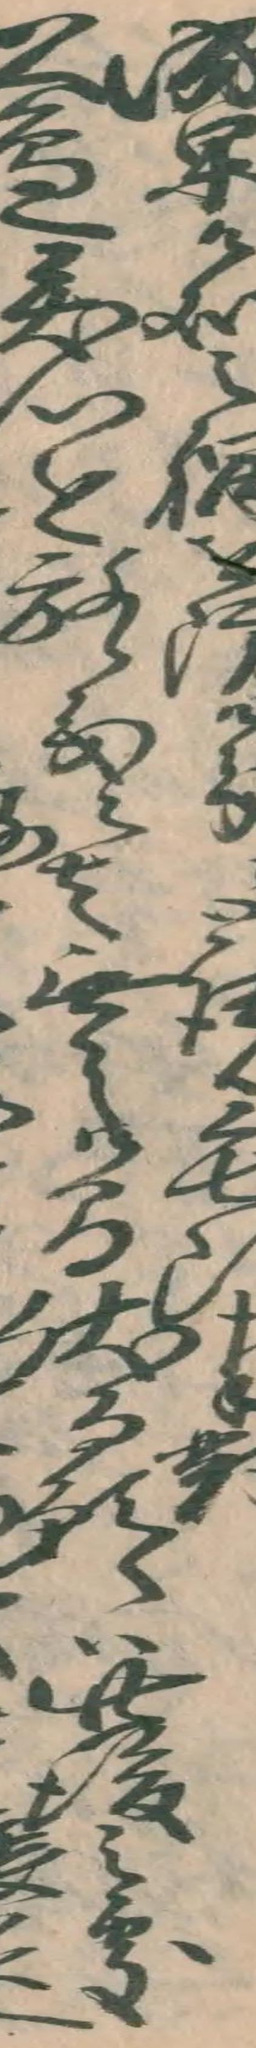公邊異心を放候義ニ者無之候間伏而願候ハ此後之處
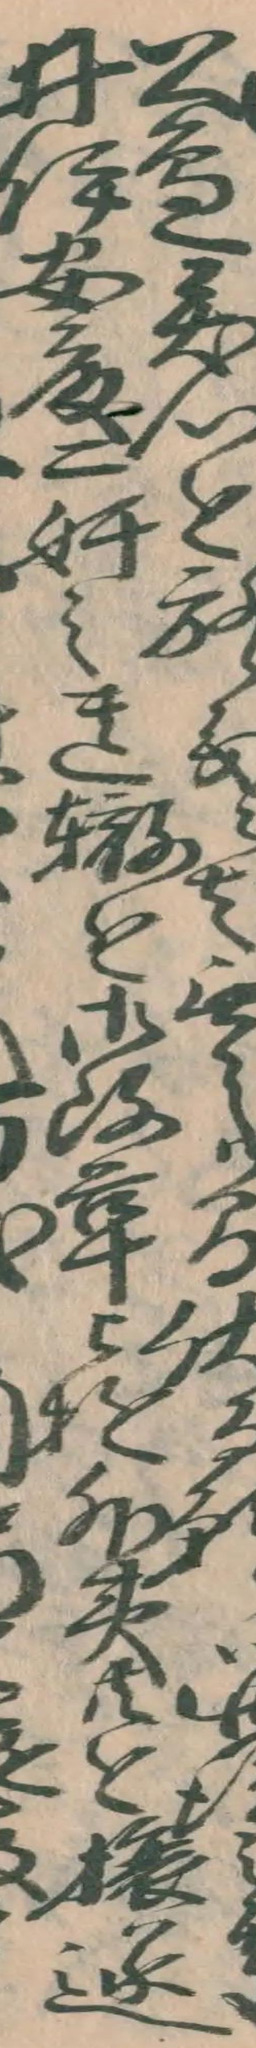井伊安藤二奸之遺轍を御改革被遊外夷共を攘逐
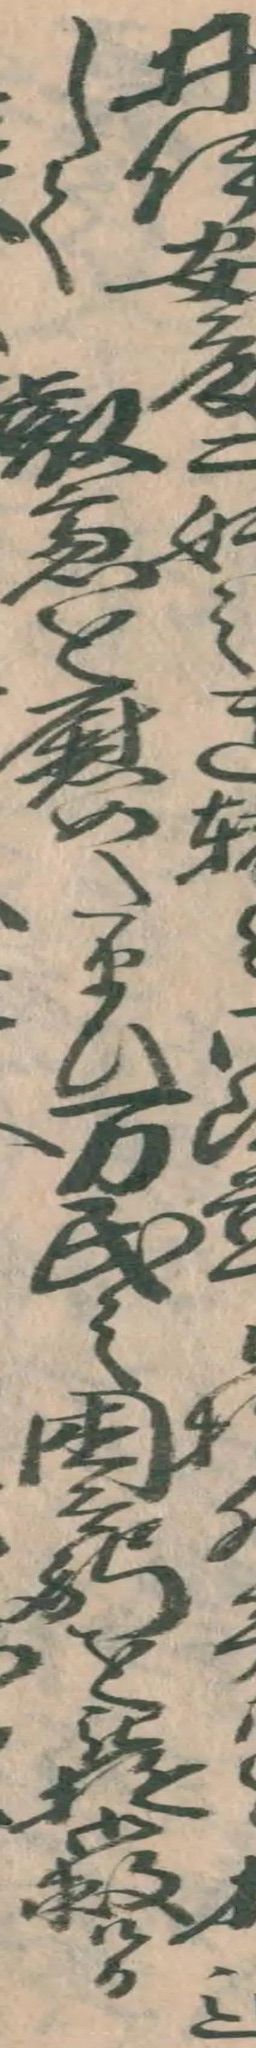して叡慮を慰めたまひ万民之困窮を被遊御救候而
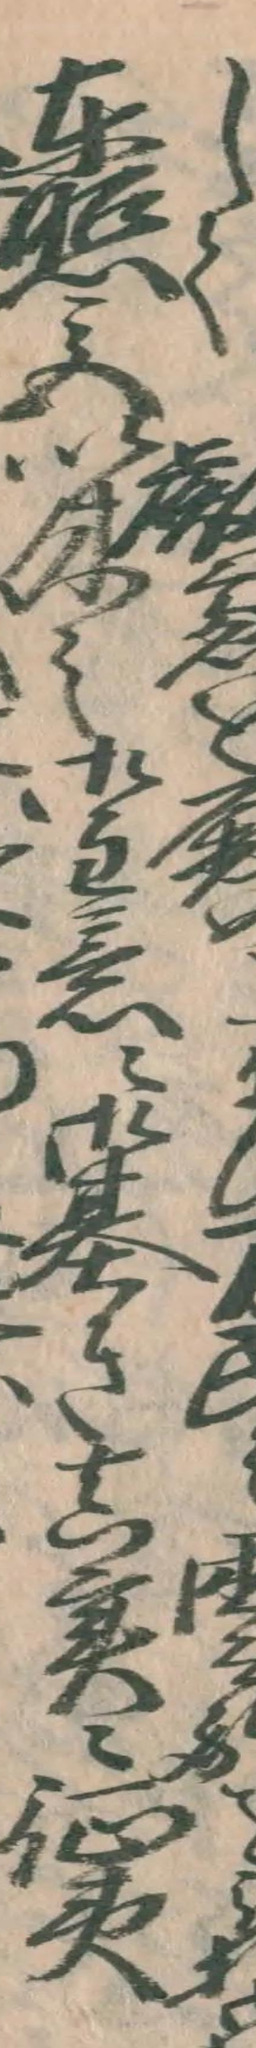東照宮以来之御主意ニ御基き真実ニ征夷
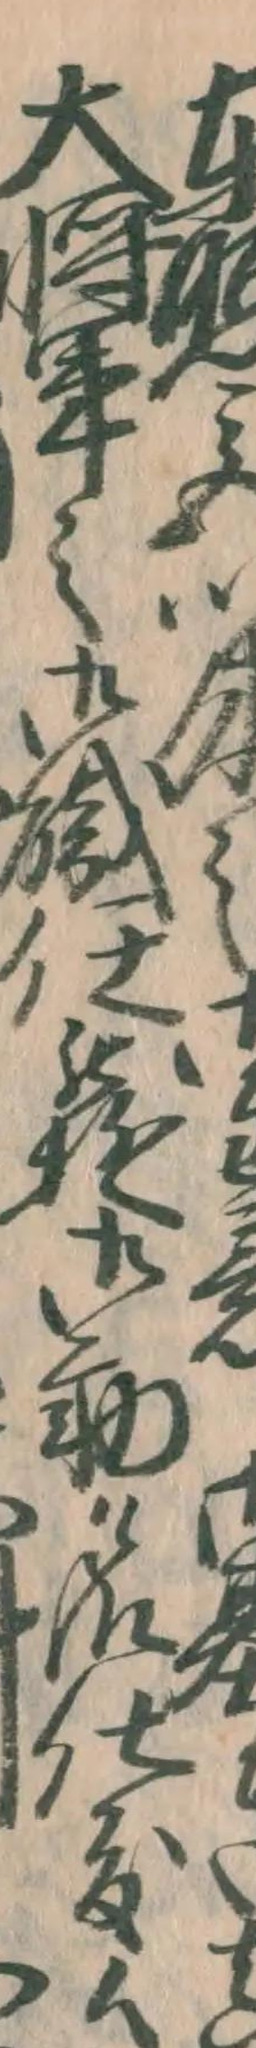大将軍之御職任被遊御勤候様仕度候
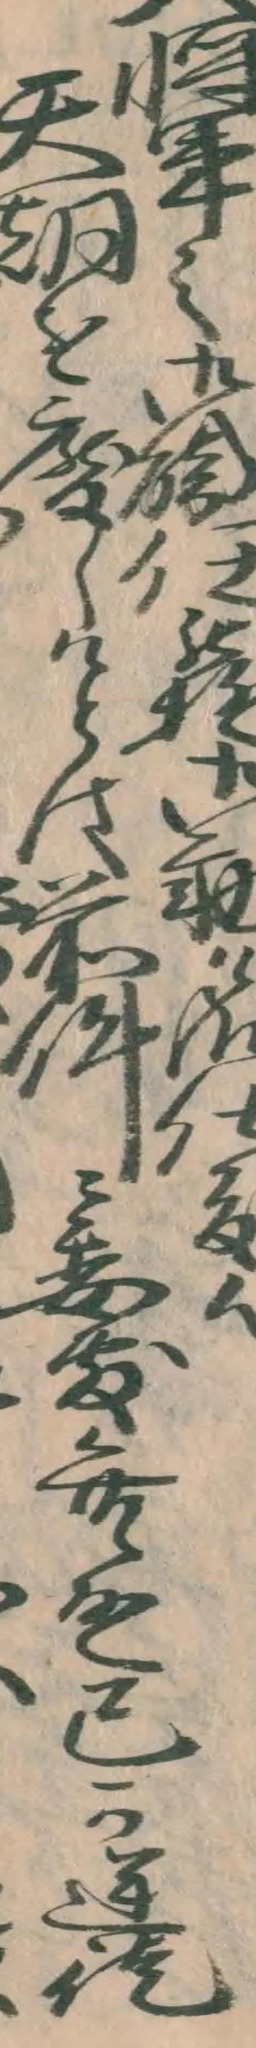天朝を廃し候とは前件ニ委敷弁候通己か逆徒
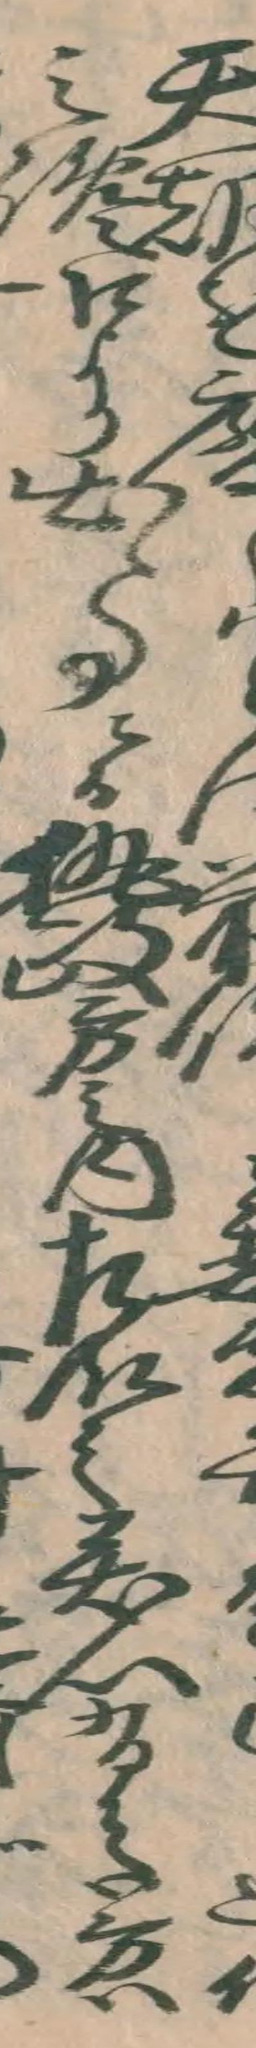之讒口より出候事ニ而執政方之内左様之異心有之御方ハ
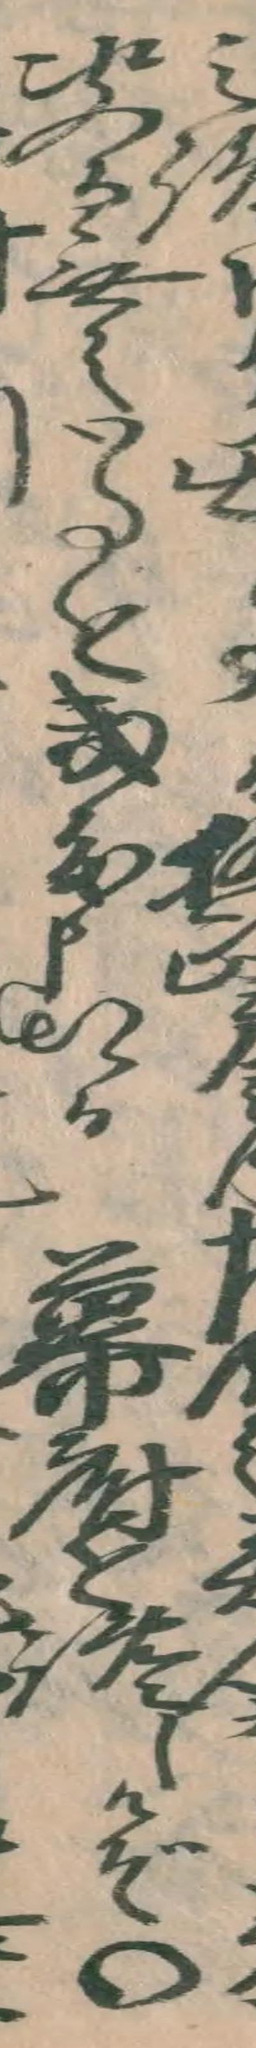決而無之御事と幾度申出候而幕府を讒し候ぞ○
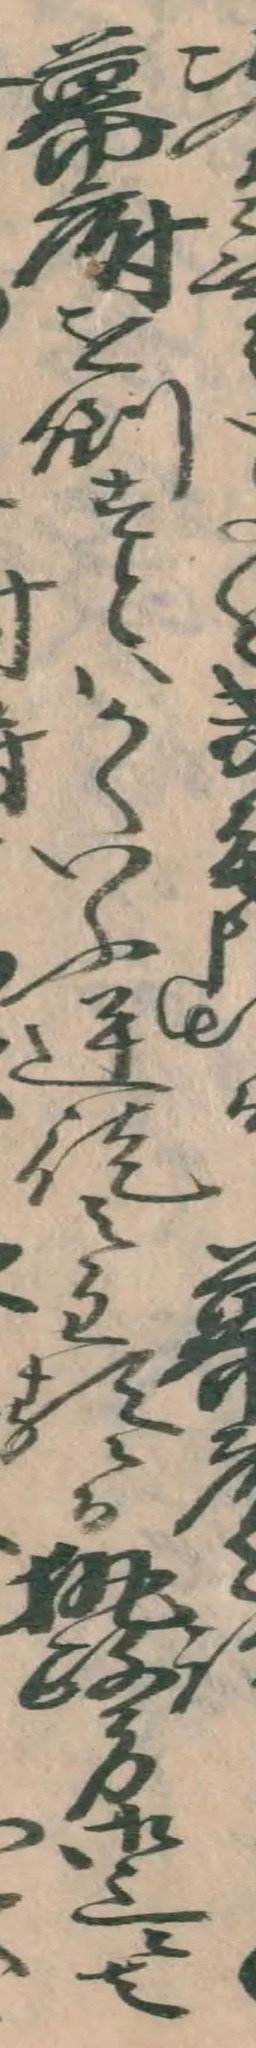幕府を倒すとハかくいふ逆徒之主類ニ而執政方御上ニ者
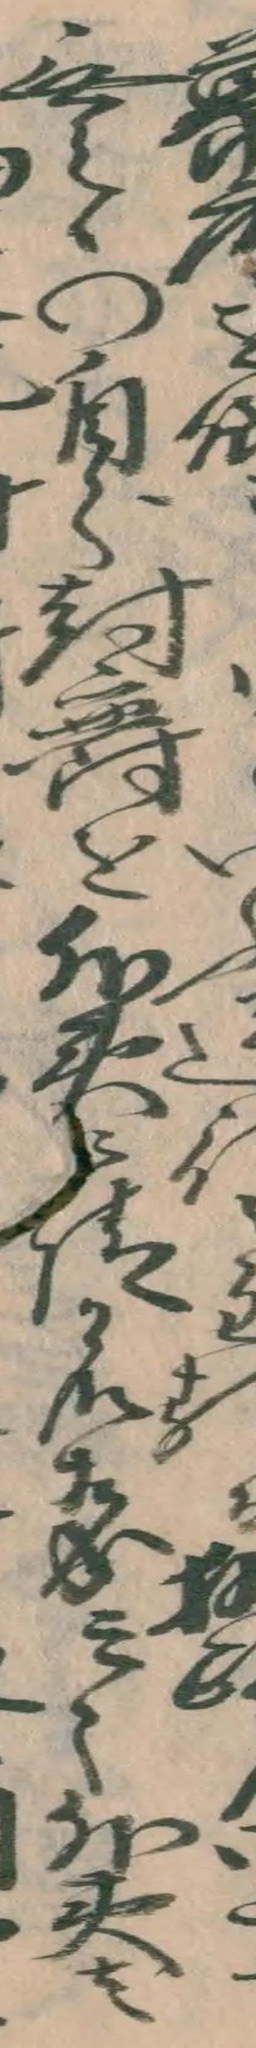無之候○自ら封爵を外夷ニ請候様相成云々外夷者
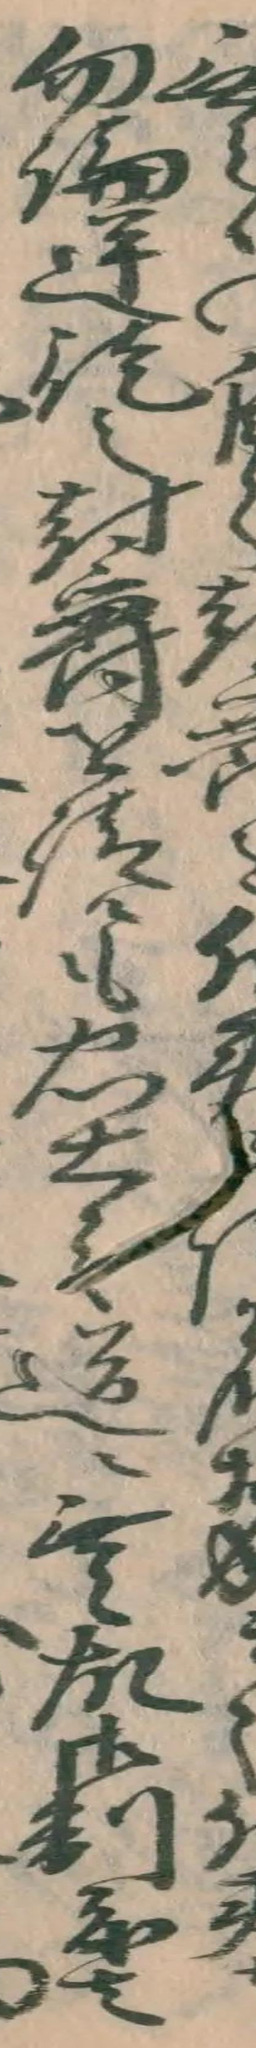勿論逆徒之封爵を請候も忠士之道ニ無之故御制度者
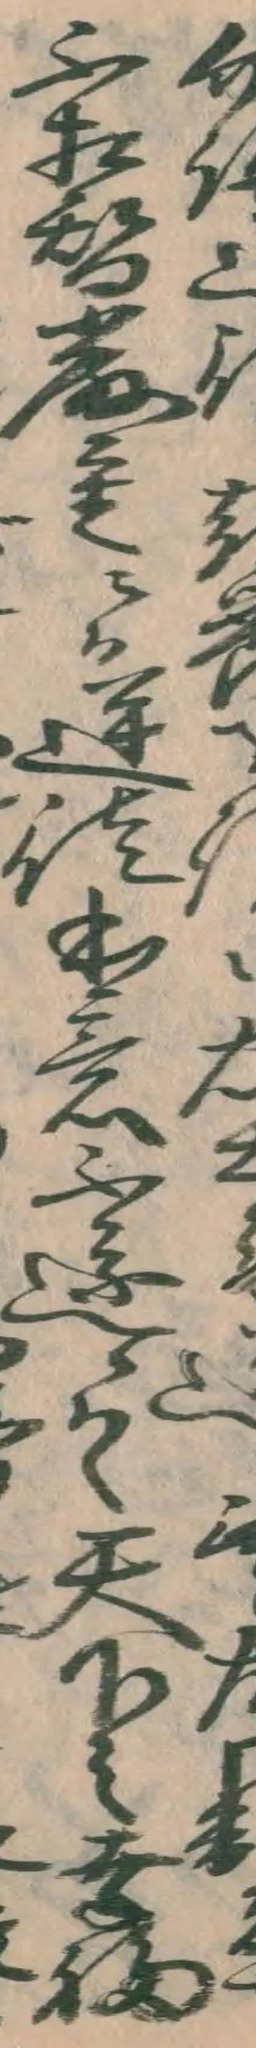不相替厳重ニ而逆徒本意不遂候ハヽ天下之幸福
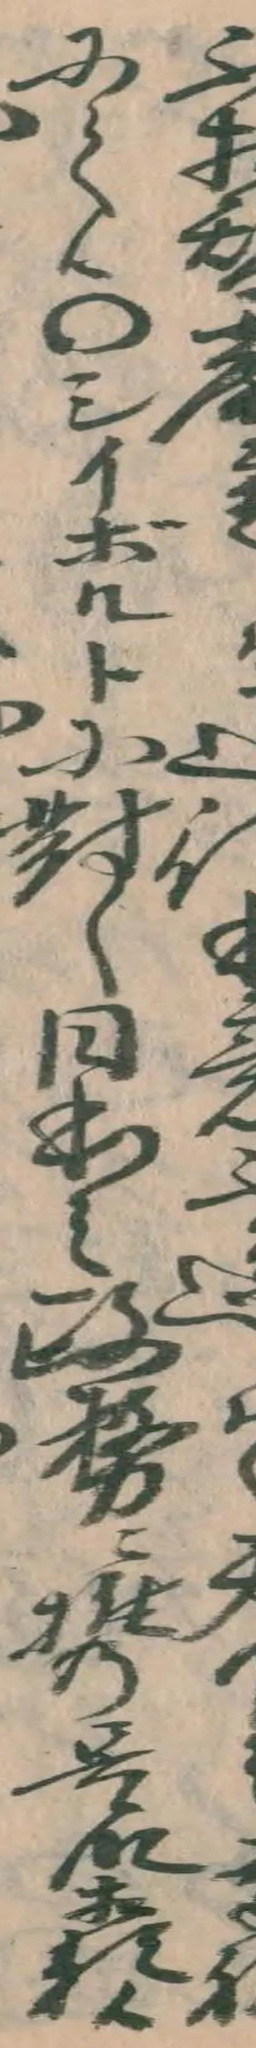にて候〇シイボルトに對し日本之政務ニ携呉候様相頼候
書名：麗斎叢書. 20
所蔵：国立国会図書館 National Diet Library, JAPAN
